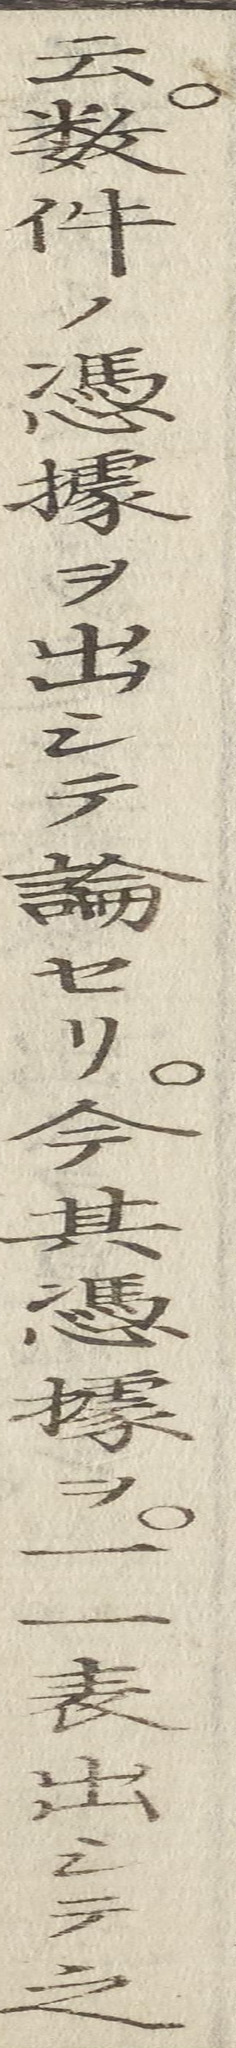云。数件ノ憑拠ヲ出シテ論セリ。今其憑拠ヲ。一一表出シテ之

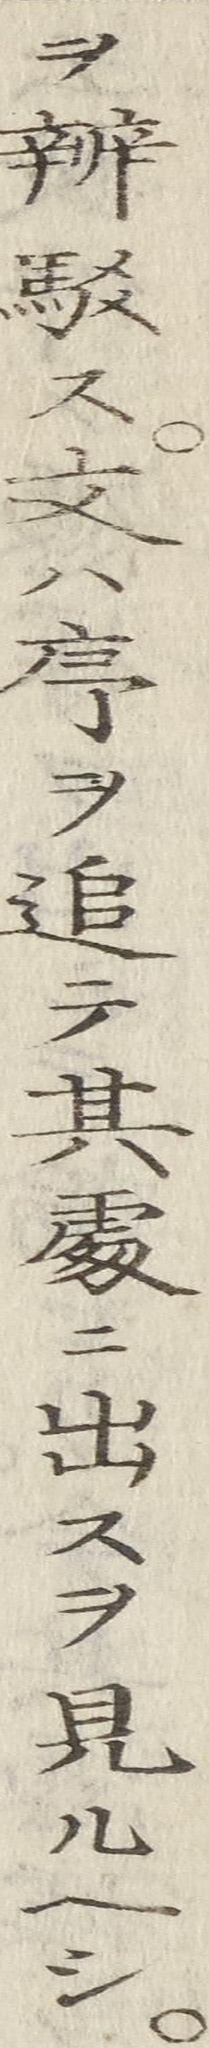ヲ弁駁ス。文ハ序ヲ追テ其処ニ出スヲ見ルヘシ。
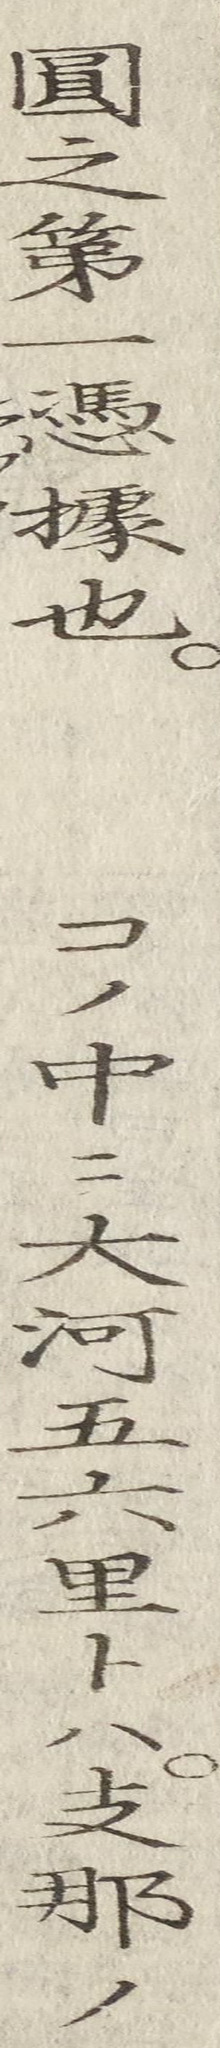円之第一憑拠也。コノ中ニ大河五六里トハ。支那ノ
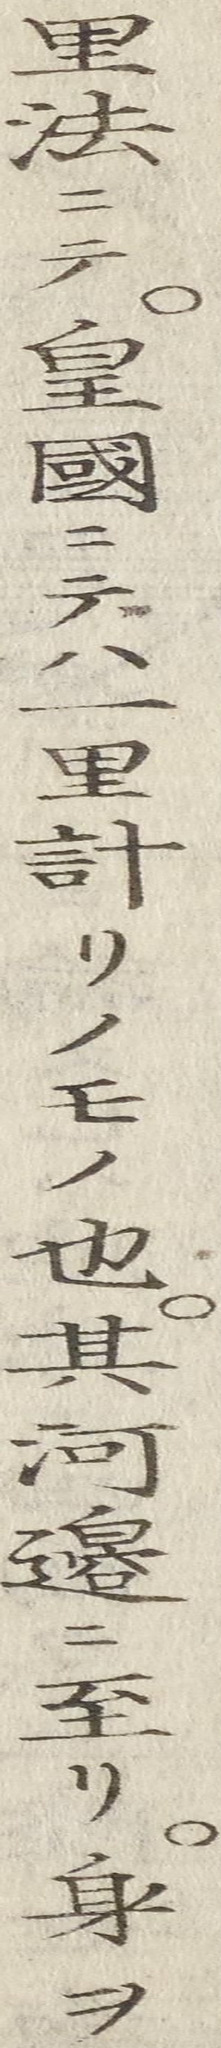里法ニテ。皇国ニテハ一里計リノモノ也。其河辺ニ至リ。身ヲ
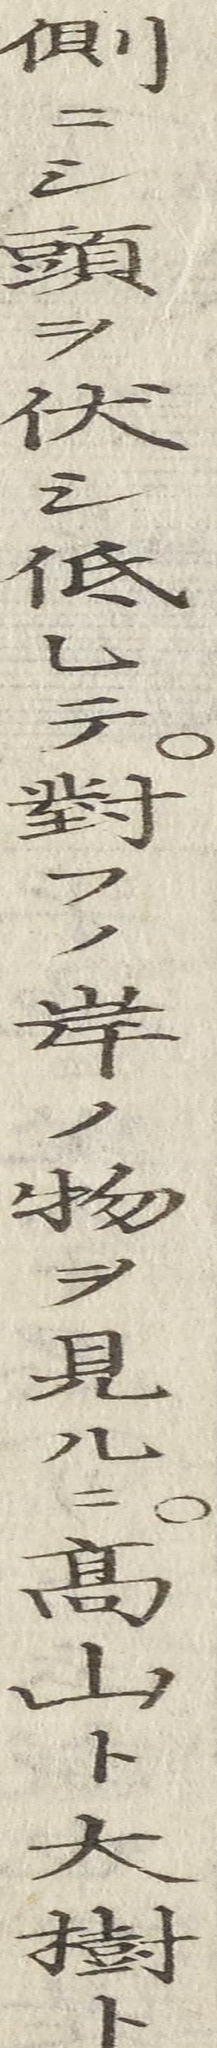側ニシ頭ヲ伏シ低レテ。対フノ岸ノ物ヲ見ルニ。高山ト大樹ト
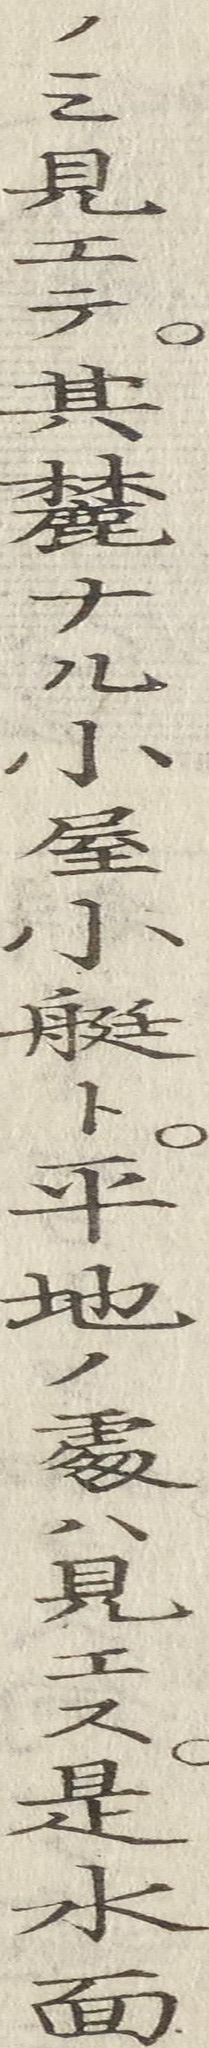ノミ見エテ。其麓ナル小屋小艇ト。平地ノ処ハ見エス。是水面
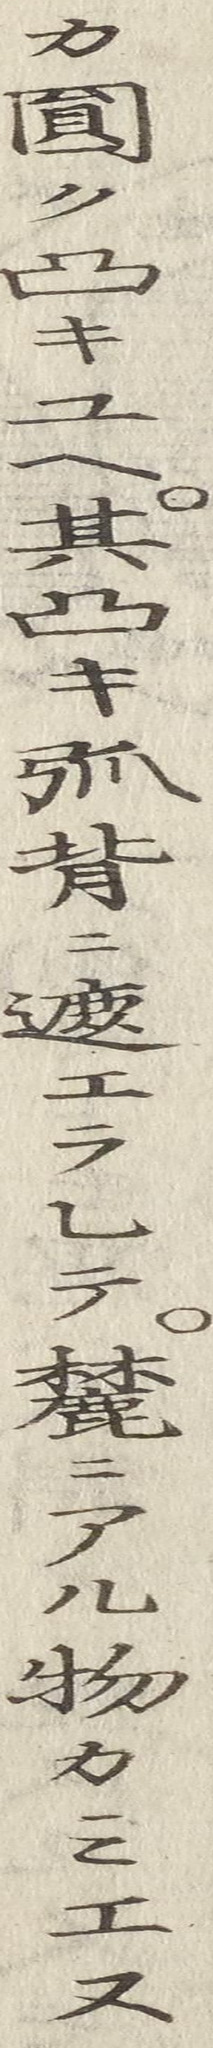カ円ク凸キユヘ。其凸キ弧背ニ遮エラレテ。麓ニアル物カミエス
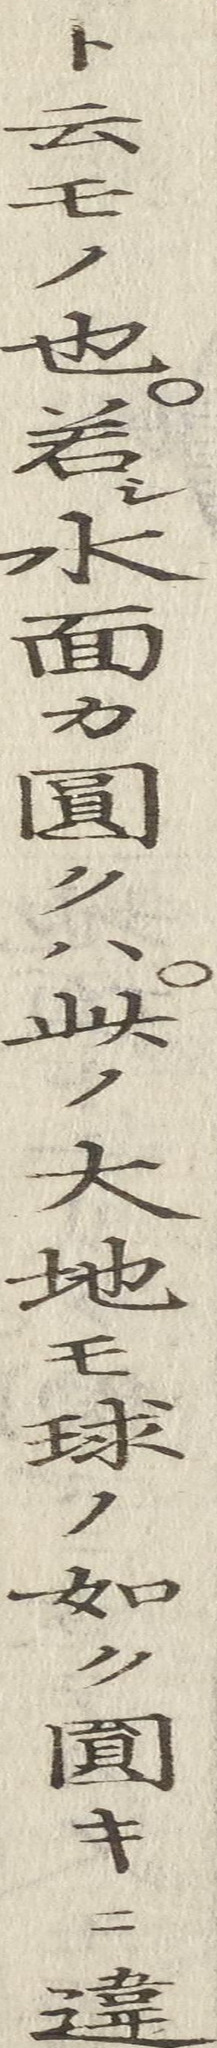ト云モノ也。若水面カ円クハ。此ノ大地モ球ノ如ク円キニ違
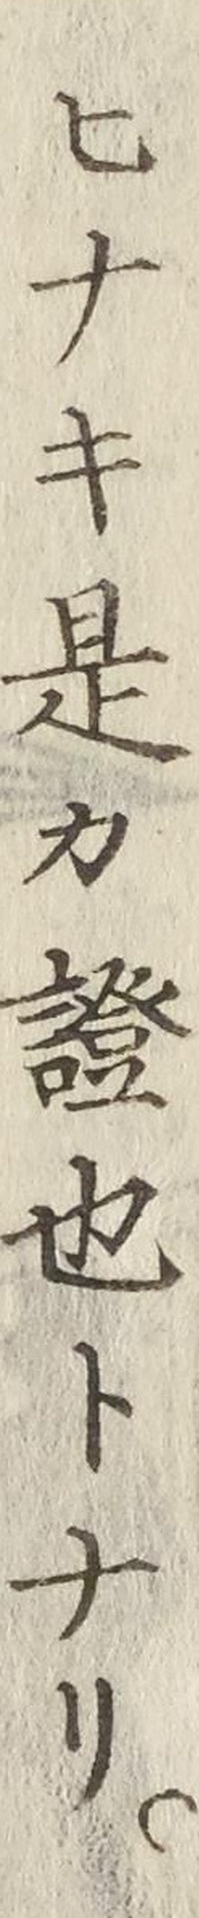ヒナキ是カ証也トナリ。
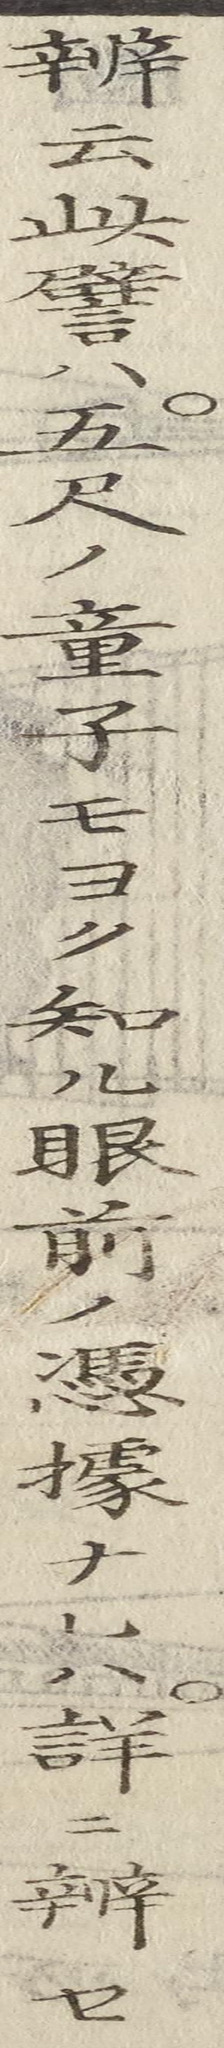弁云此譬ハ。五尺ノ童子モヨク知ル眼前ノ憑拠ナレハ。詳ニ弁セ
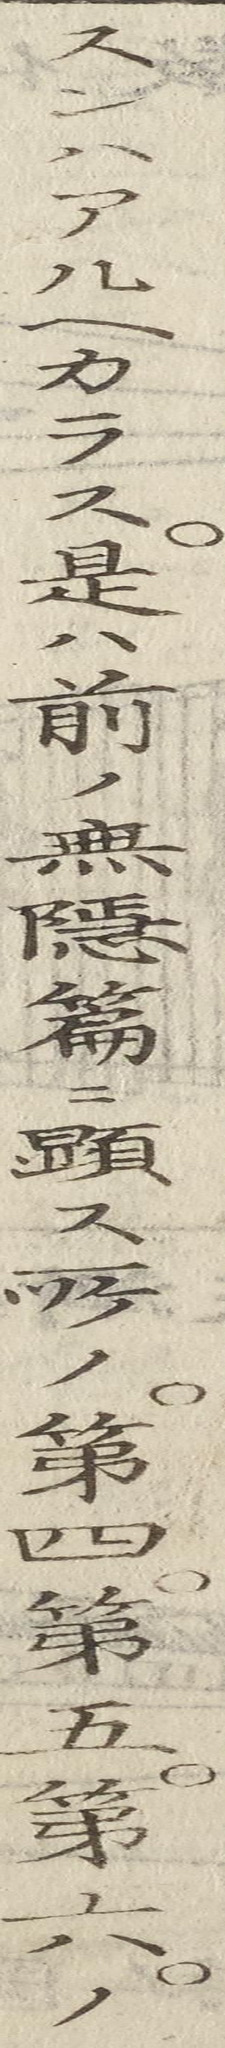スンハアルヘカラス。是ハ前ノ無隠篇ニ顕ス所ノ。第四。第五。第六。ノ
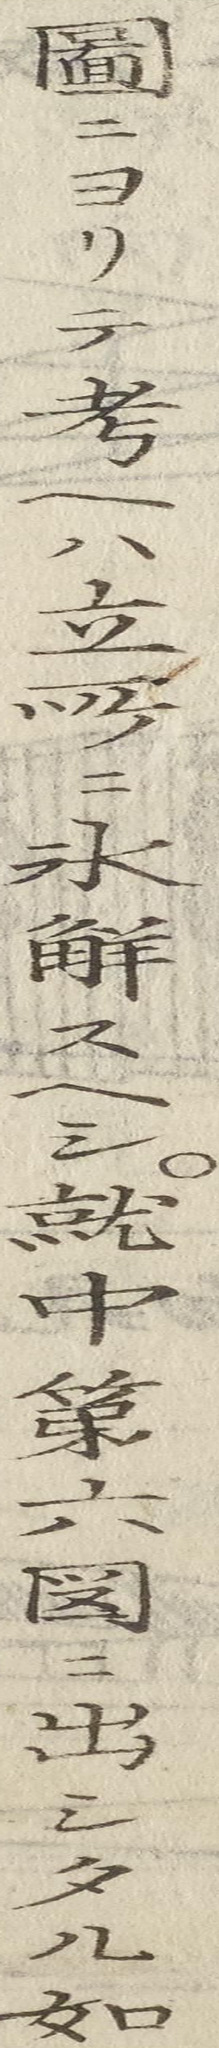図ニヨリテ考ヘハ立所ニ氷解スヘシ。就中第六図ニ出シタル如
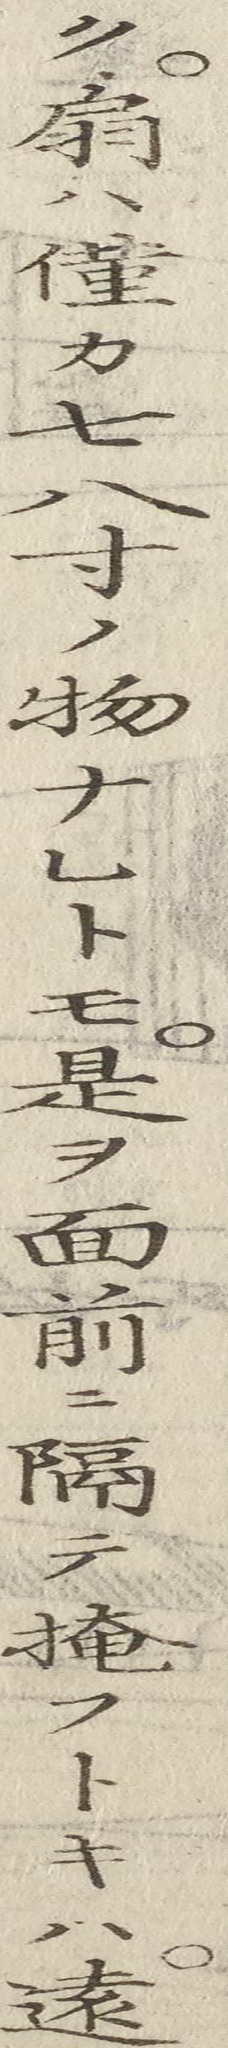ク。扇ハ僅カ七八寸ノ物ナレトモ。是ヲ面前ニ隔テ掩フトキハ。遠
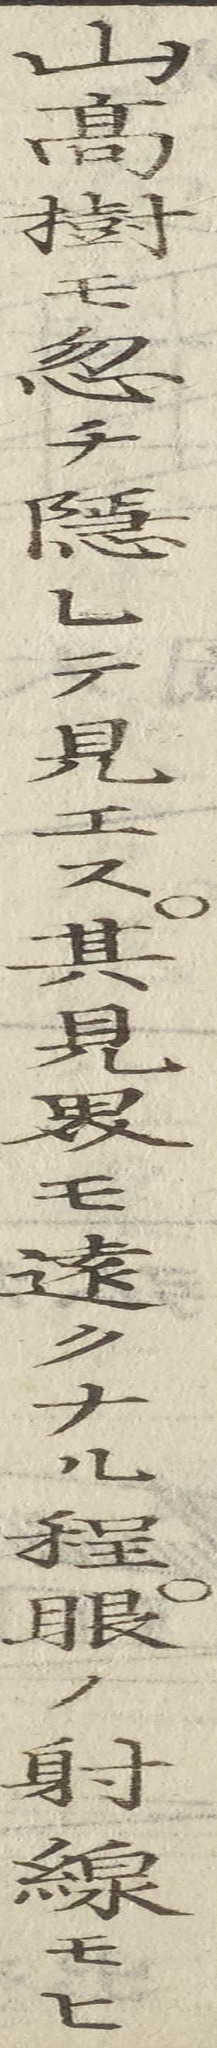山高樹モ忽チ隠レテ見エス。其見界モ遠クナル程。眼ノ射線モヒ
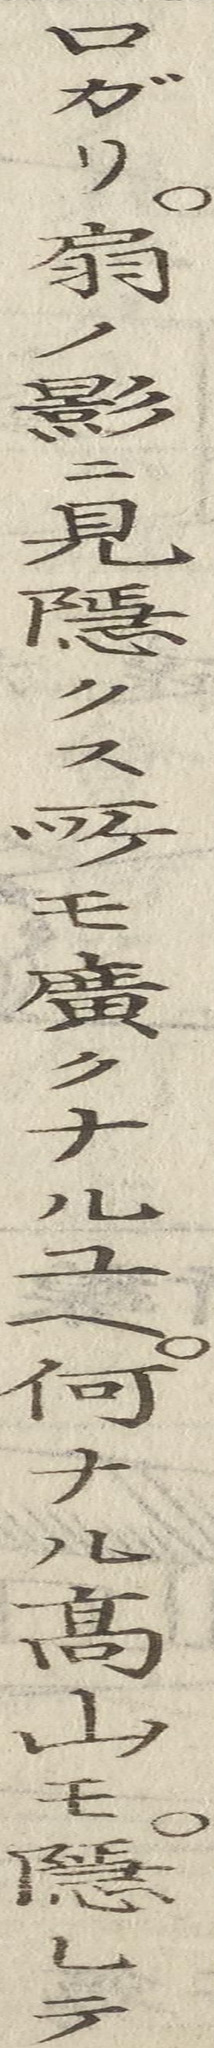ロガリ。扇ノ影ニ見隠クス所モ広クナルユヘ。何ナル髙山モ。隠レテ
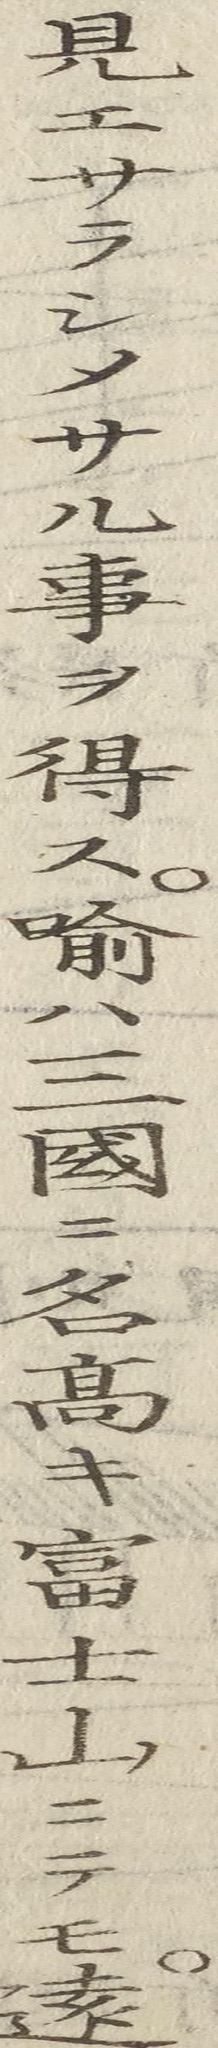見エサラシメサル事ヲ得ス。喩ハ三国ニ名高キ富士山ニテモ。遠
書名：護法新論　中
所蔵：東京大学地震研究所図書室 Earthquake Research Institute Library, The University of Tokyo, JAPAN
